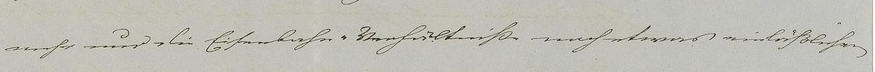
mehr nur die Eisenbahn-Verhältniße noch etwas einläßlicher
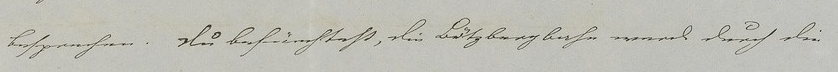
besprechen. Du befürchtest, die Bötzbergbahn werde durch die
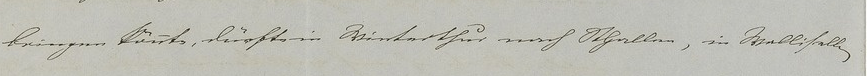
bringen könnte, dürfte in Winterthur nach St Gallen, in Wallisellen
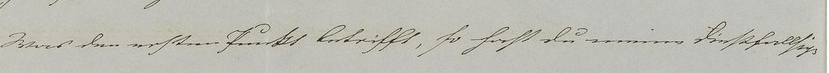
Was den ersten Punkt betrifft, so hast du meine dießfallsige
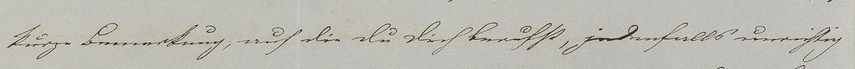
kurze Bemerkung, auf die du dich berufst, jedenfalls unrichtig
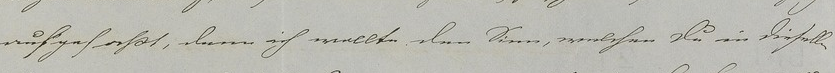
aufgefaßt, denn ich wollte den Sinn, welchen du in dieselbe
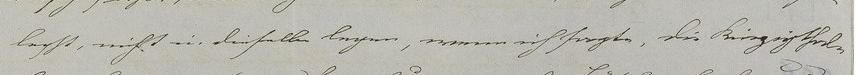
legst, nicht in dieselbe legen, wenn ich sagte, die Kinzigthal -
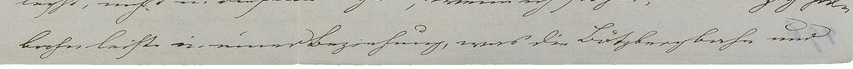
bahn leiste in einer Beziehung, was die Bötzbergbahn und
